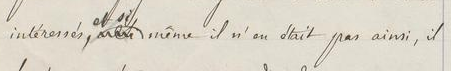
intéressés, Siet si même il n'en était pas ainsi, il
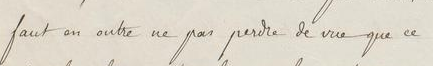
faut en outre ne pas perdre de vue que ce
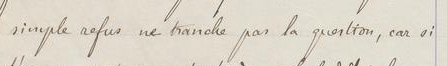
simple refus ne tranche pas la question, car si
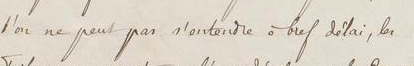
l'on ne peut pas s'entendre à bref délai, les
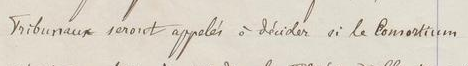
Tribunaux seront appelés à décider si le Consortium
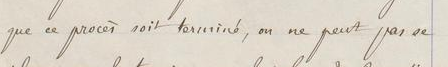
que ce procès soit terminé, on ne peut pas se
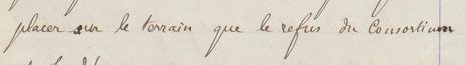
placer sur le terrain que le refus du Consortium
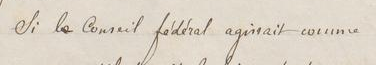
Si le Conseil fédéral agissait comme
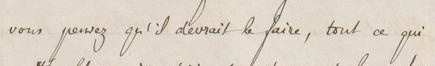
vous pensez qu'il devrait le faire, tout ce qui
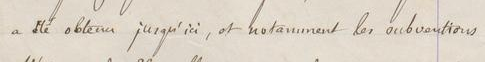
a été obtenu jusqu'ici, et notamment les subventions
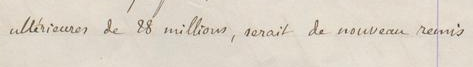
ultérieures de 28 millions, serait de nouveau remis
